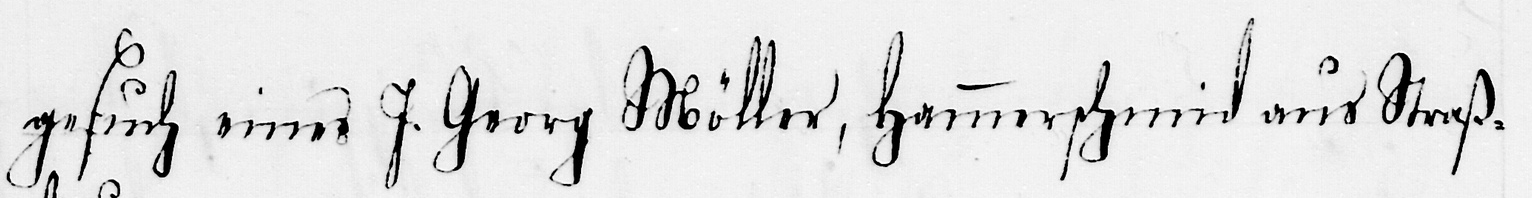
gesuch eines J. Georg Möller, Hammerschmid aus Straß¬
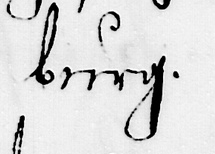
burg.
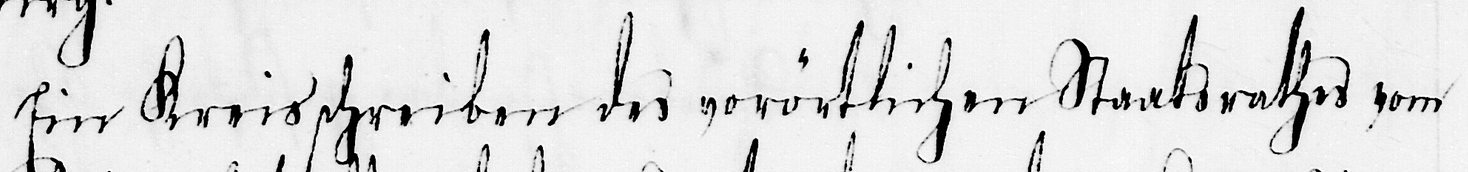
Ein Kreisschreiben des vorörtlichen Staatsrathes vom
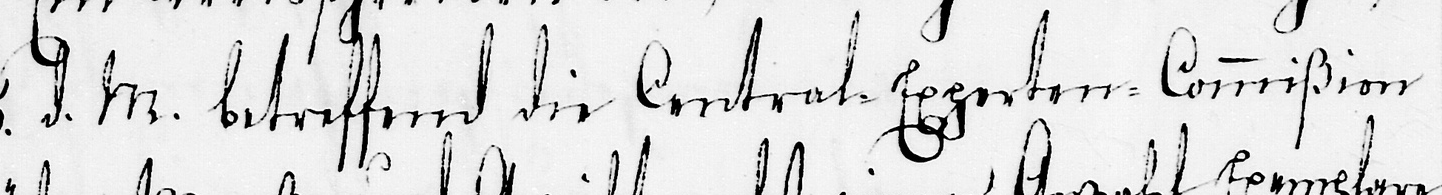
d. M. betreffend die Central-Experten-Commißion
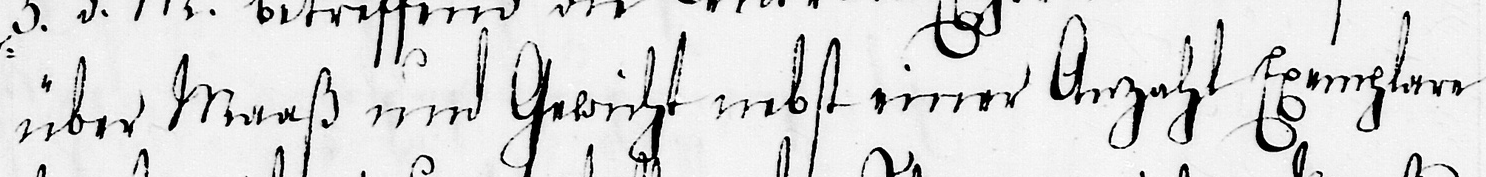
über Maaß und Gewicht nebst einer Anzahl Exemplare
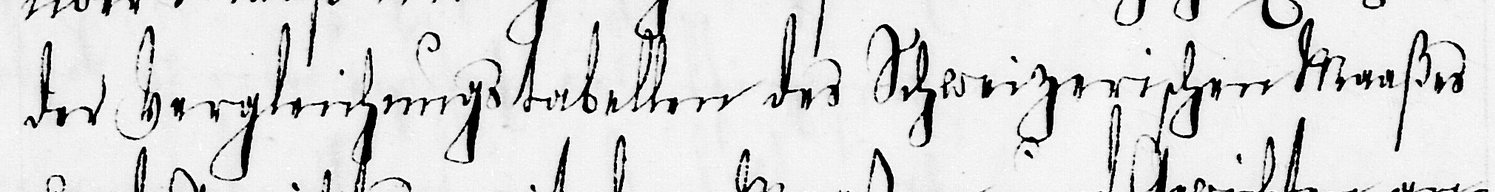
der Vergleichungstabellen des Schweizerischen Maaßes
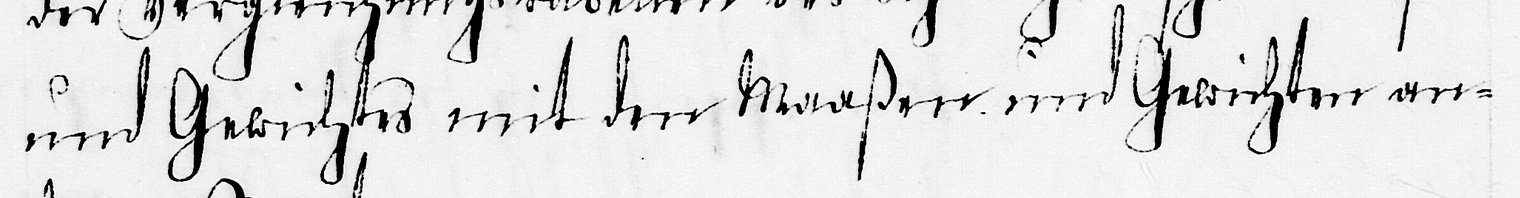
und Gewichtes mit den Maaßen und Gewichten an¬
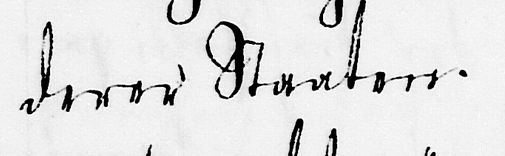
derer Staaten.
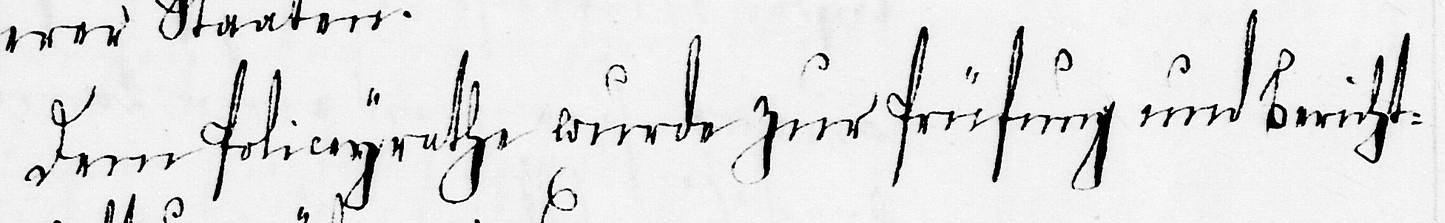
Dem Policeyrathe wurde zur Prüfung und Berich¬
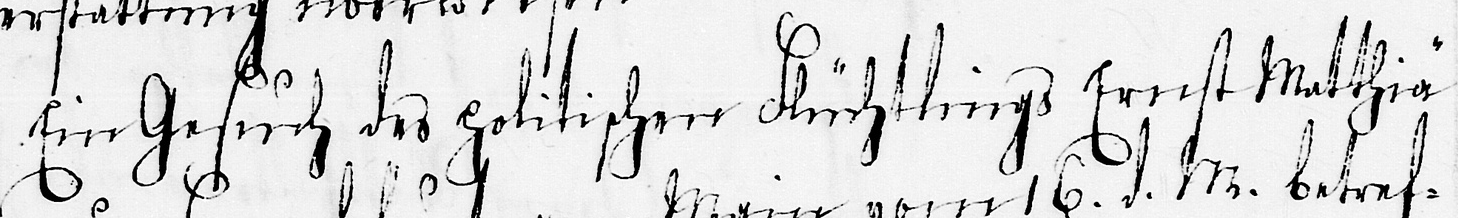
Ein Gesuch des politischen Flüchtlings Ernst Matthiä
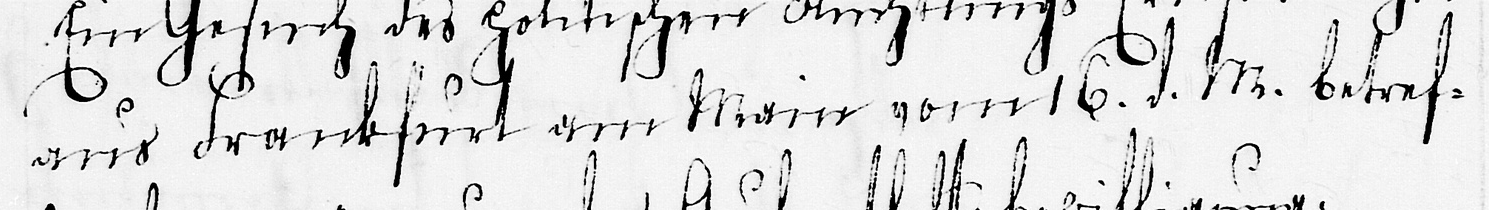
aus Frankfurt am Main vom 16. d. M. betref¬
